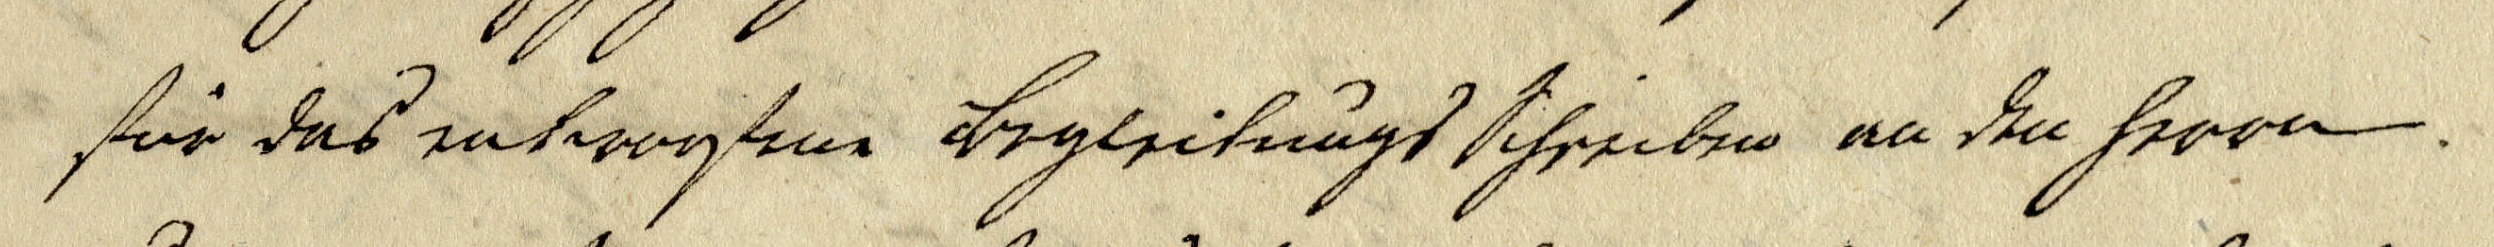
für das entworfene Begleitungs Schreiben an den Herrn
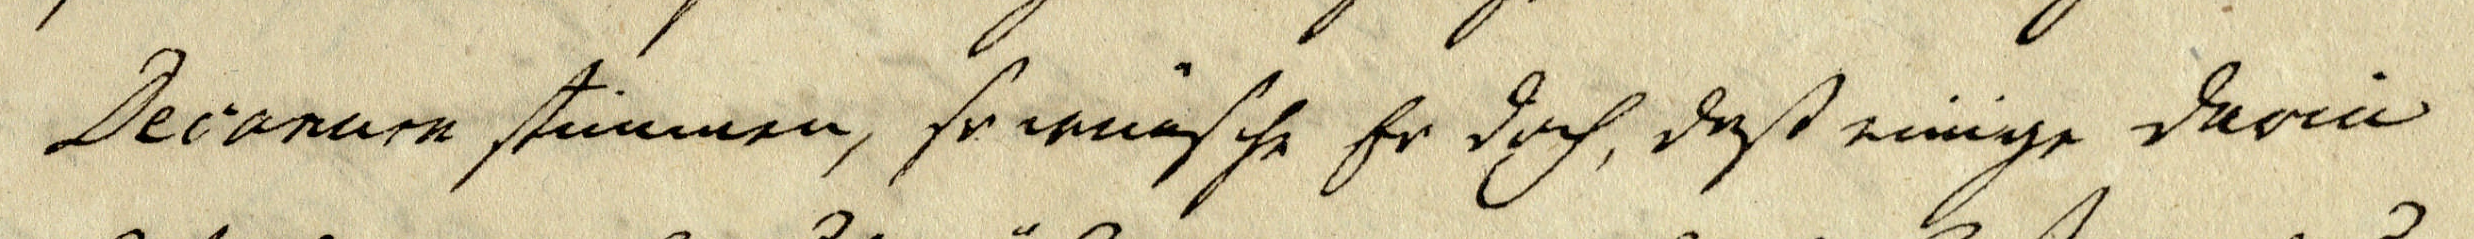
Decanum stimmen, so wünsche Er doch, daß einige darin
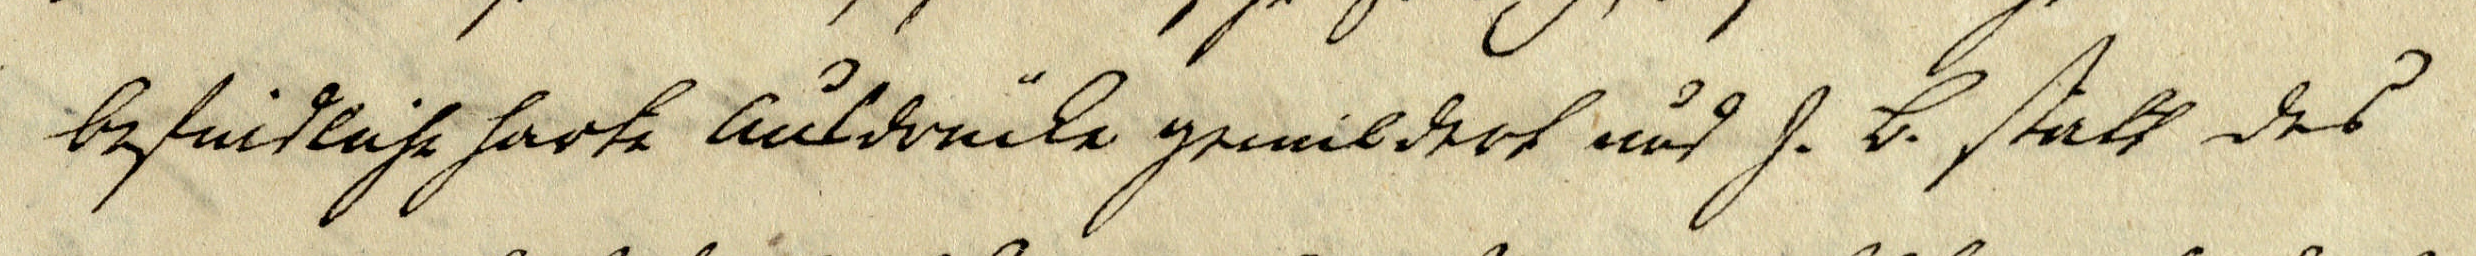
befindliche harte Ausdrücke gemildert und z. B. statt des
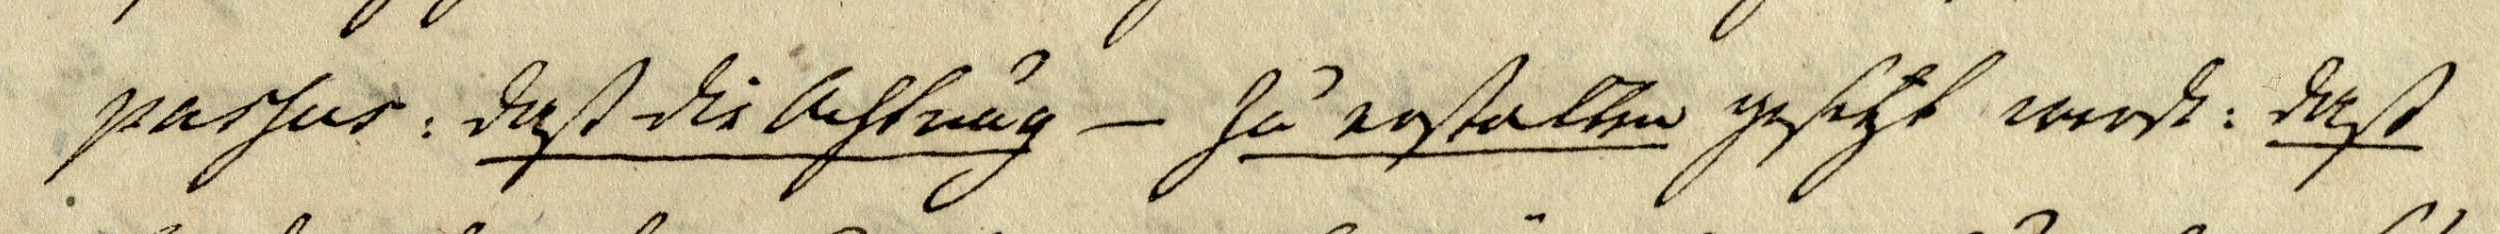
passus: daß die Achtung - zu erstatten gesetzt werde: daß
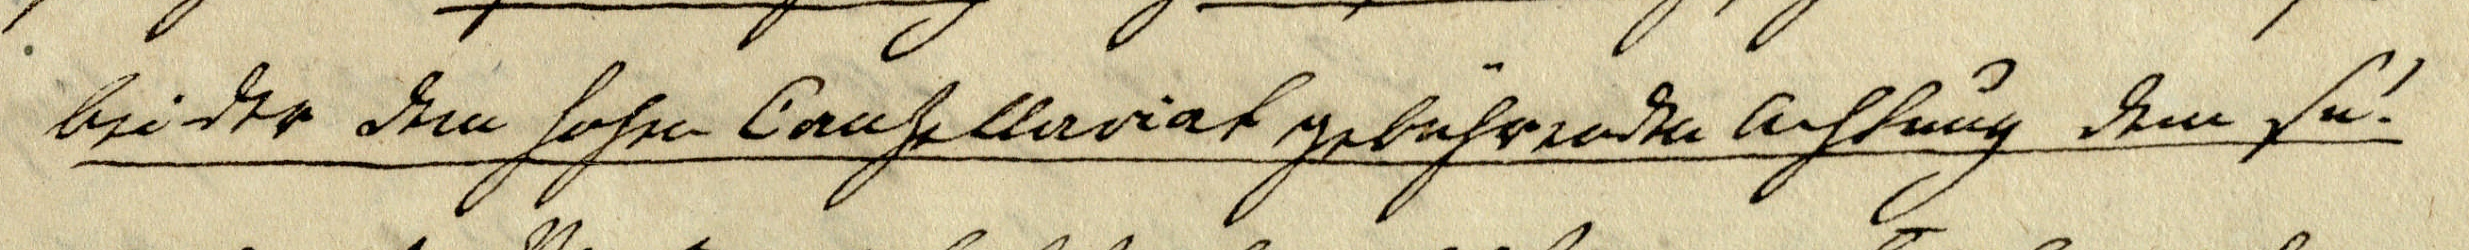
bei der dem Hohen Canzellariat gebührenden Achtung dem su¬
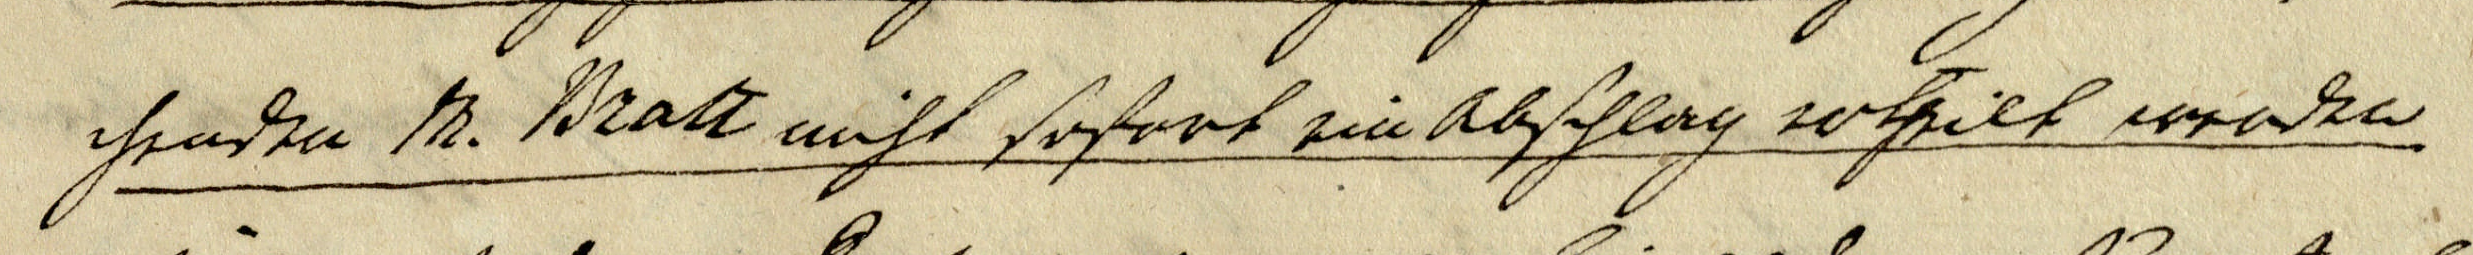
chenden M. Bratt nicht sofort ein Abschlag ertheilt werden
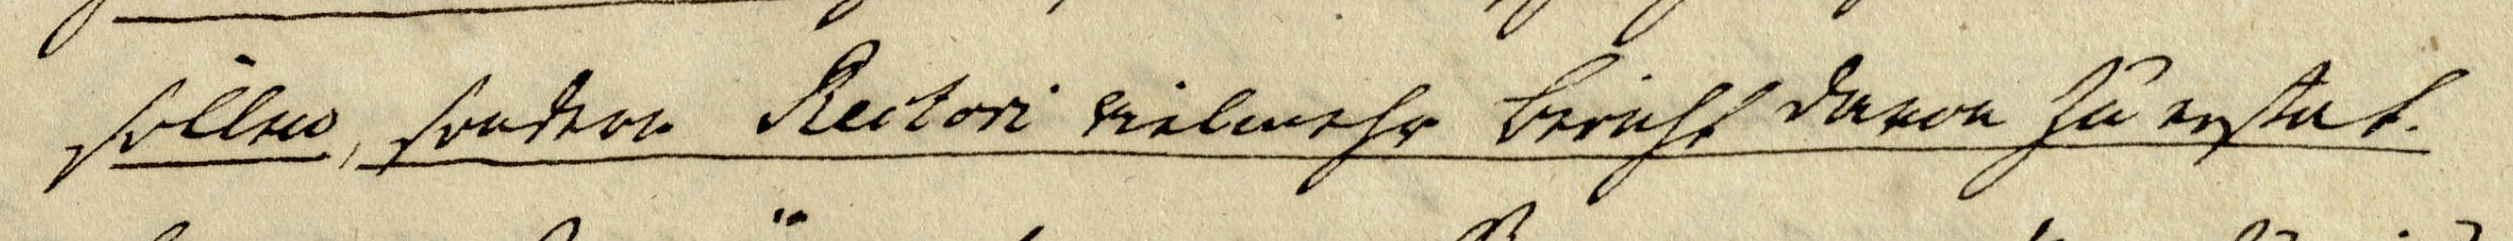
sollen, sondern Rector vielmehr Bericht davon zuerstat¬
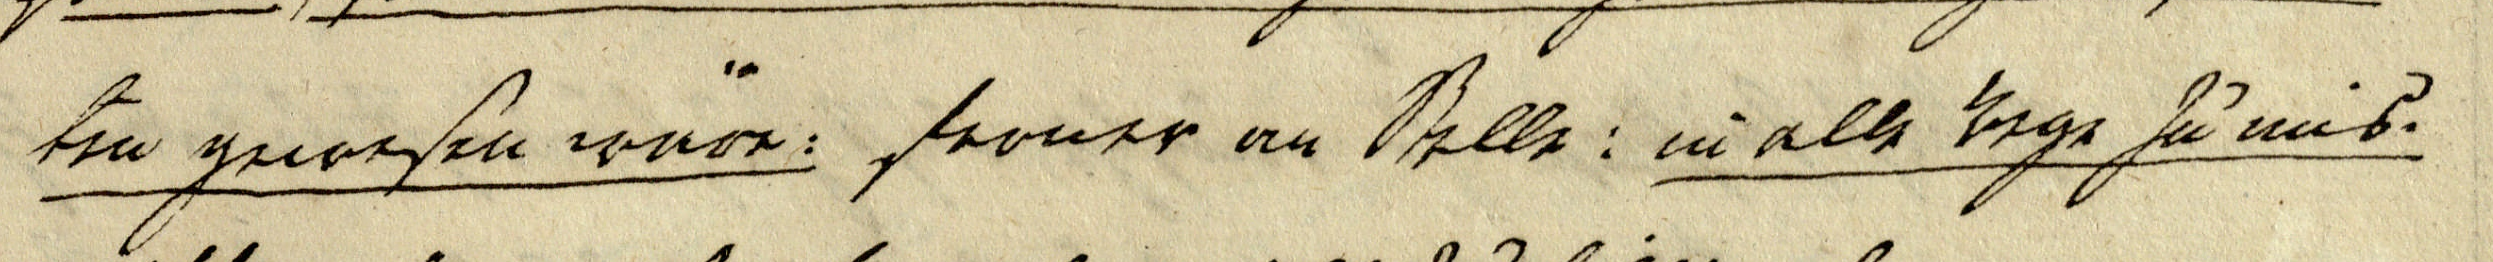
ten gewesen wäre: ferner an Stelle: in alle Wege zu mis¬
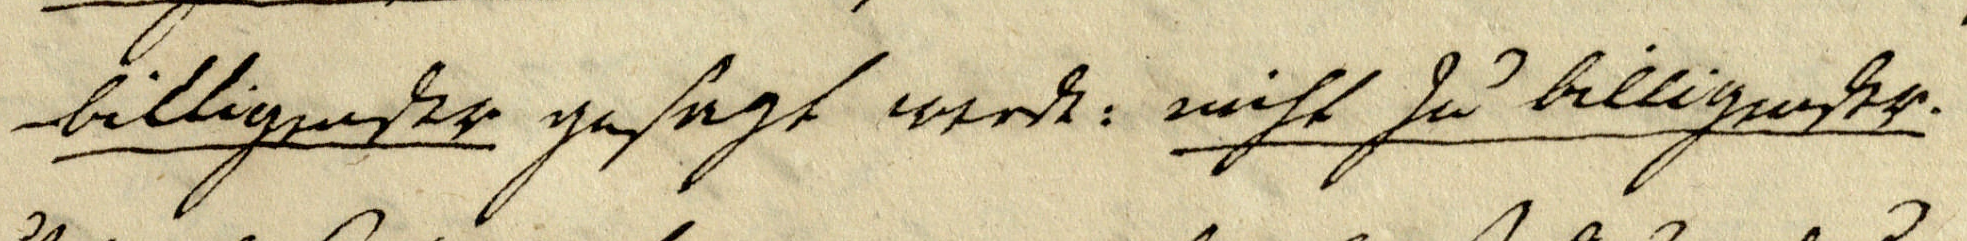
billigender gesagt werde: nicht zu billigender.
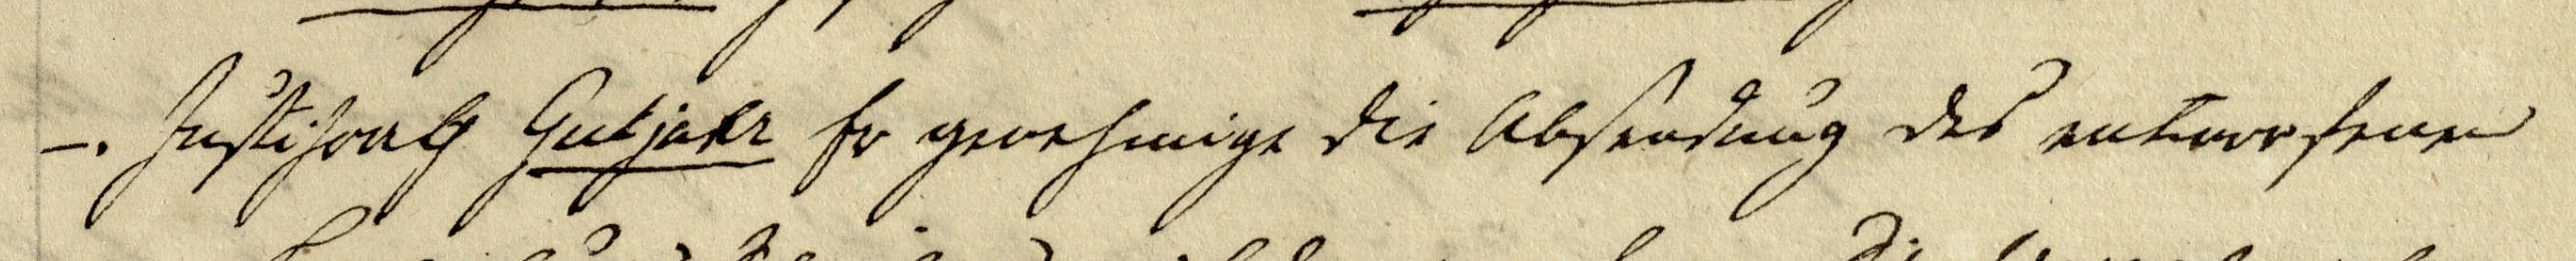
Justizrath Gutjahr Er genehmige die Absendung des entworfenen
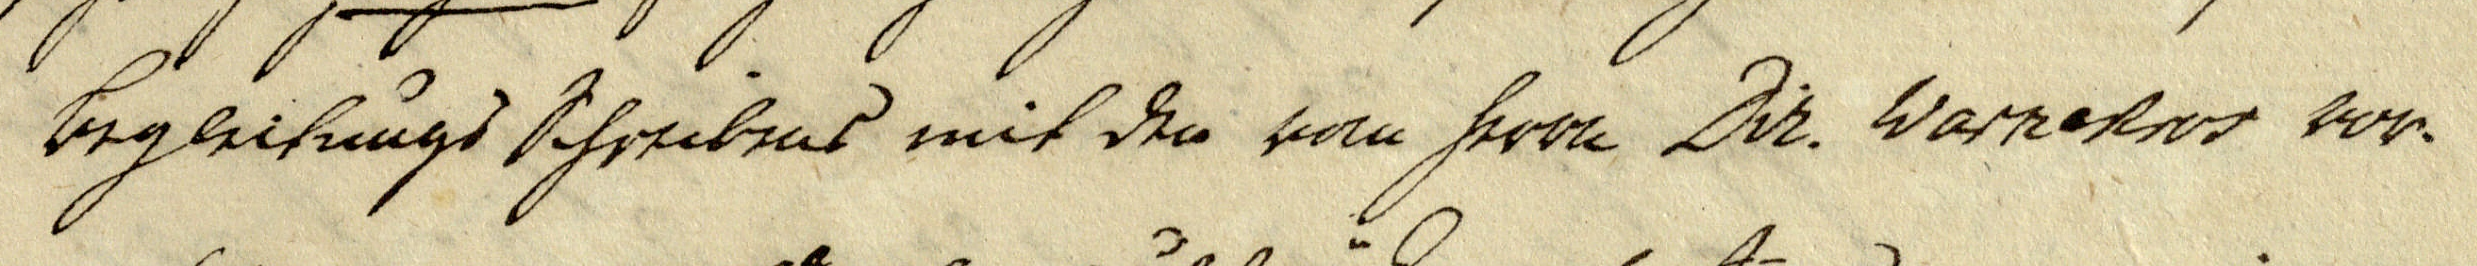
Begleitungs Schreibens mit den von Herrn Dir. Warnekros vor¬
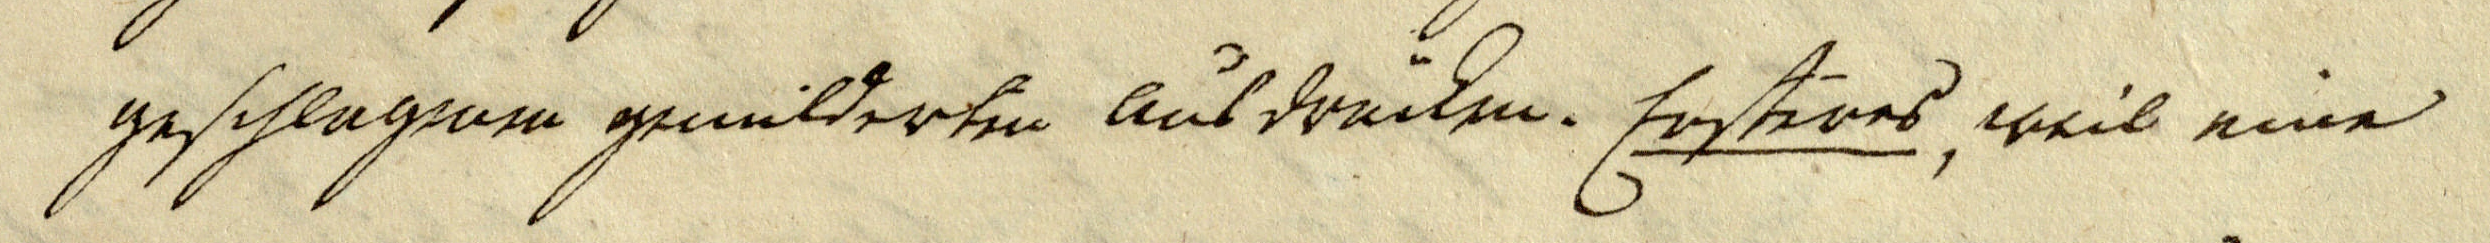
geschlagenen gemilderten Ausdrücken. Ersteres, weil eine
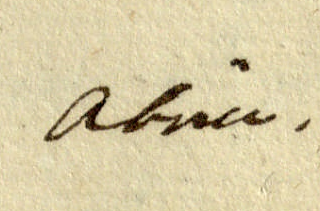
Abän¬
